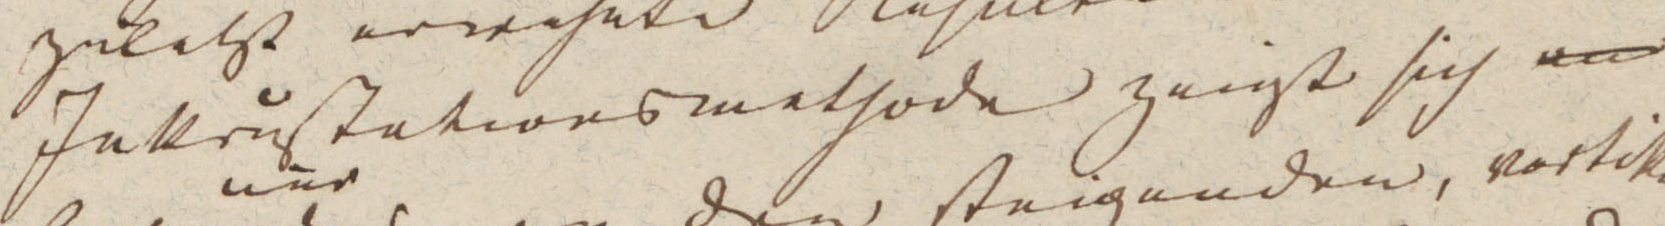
Inkrustationsmethode zeigt sich an
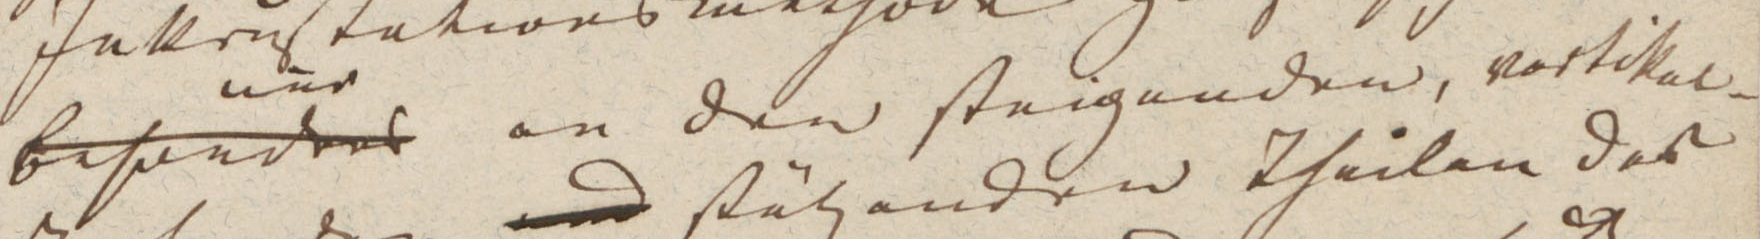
besonders nur an den steigenden, vertikal-
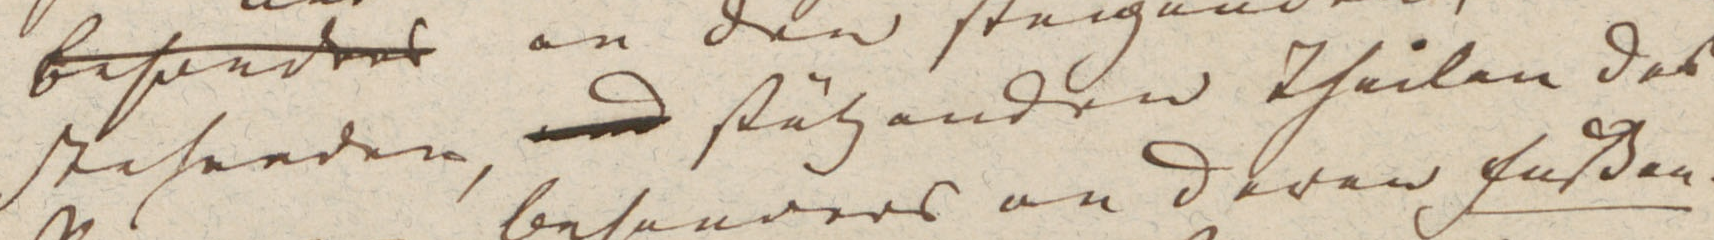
stehenden, und stützenden Theilen des
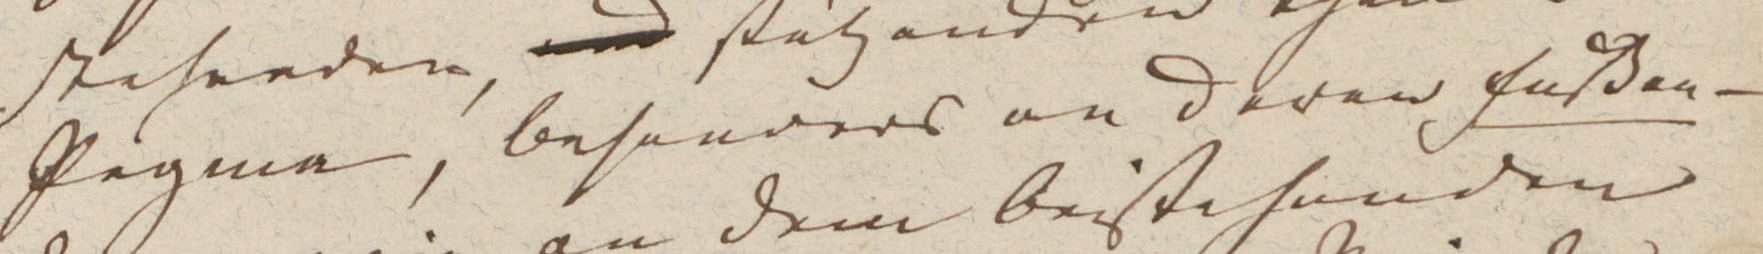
Pegma, besonders an deren Fussen-
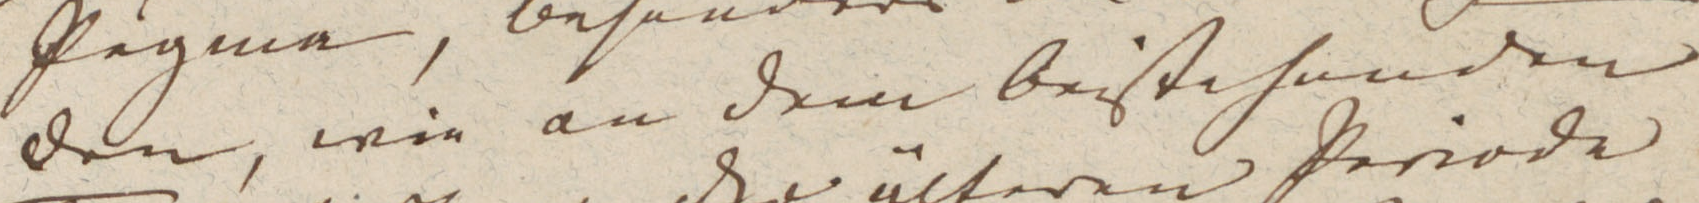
den, wie an dem beistehenden
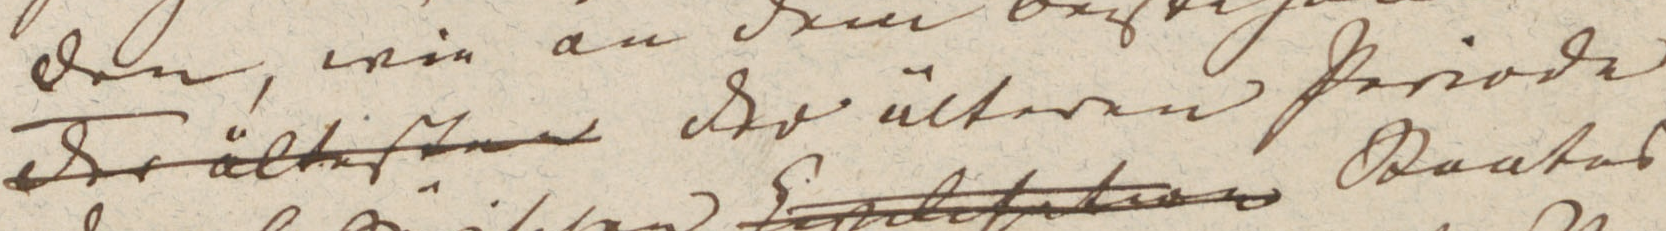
der ältesten der älteren Periode
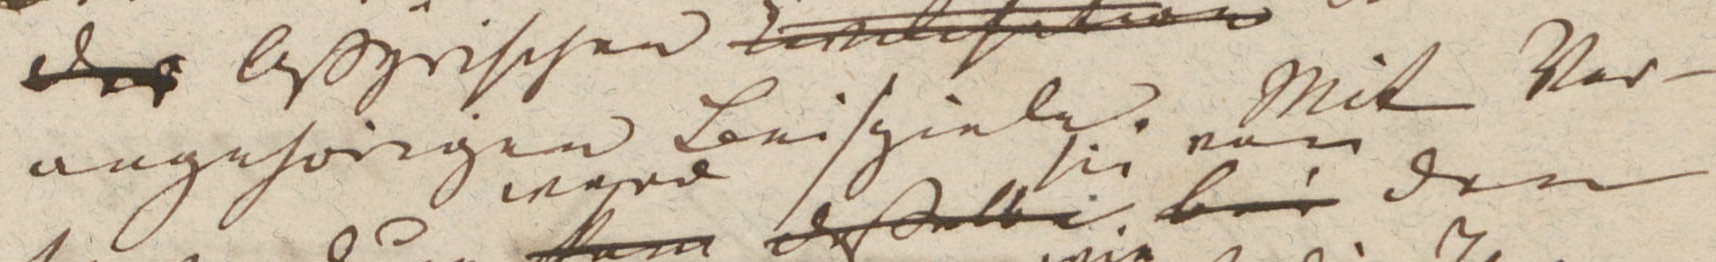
angehörigen Beispiele. Mit Ver-
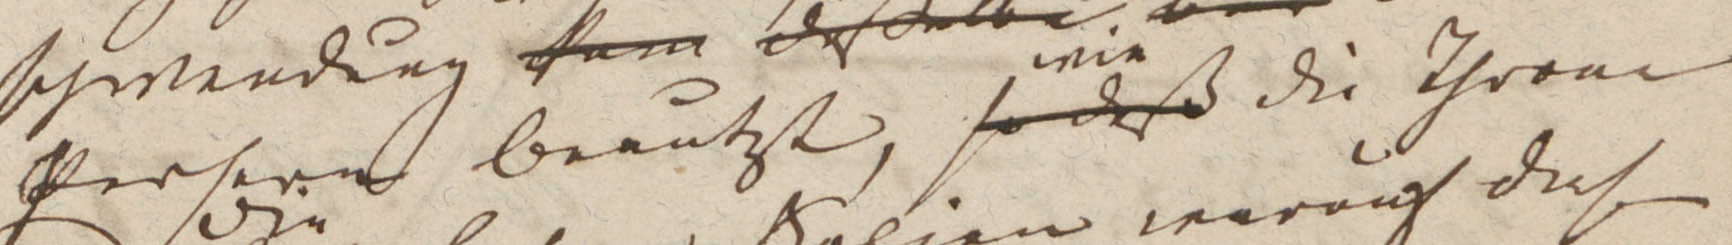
Persern benutzt, so dass wie die Throne
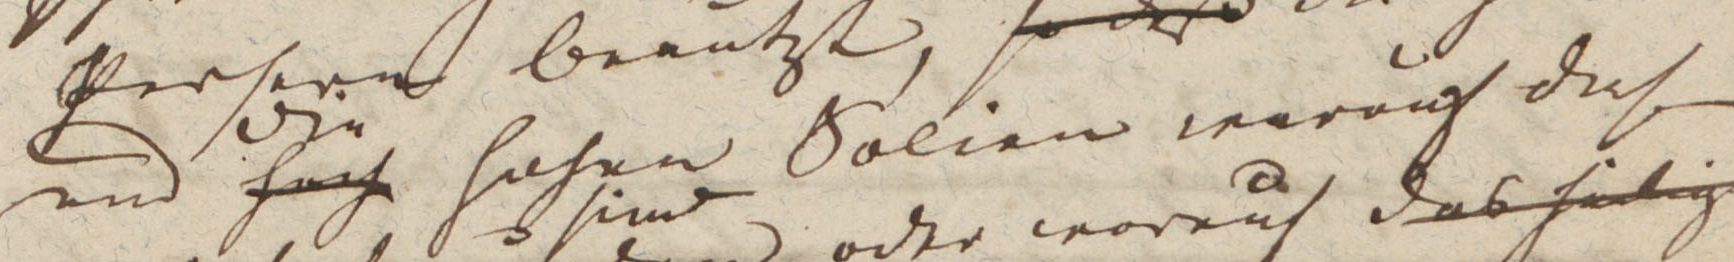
und hoch die hohen Solien worauf diese
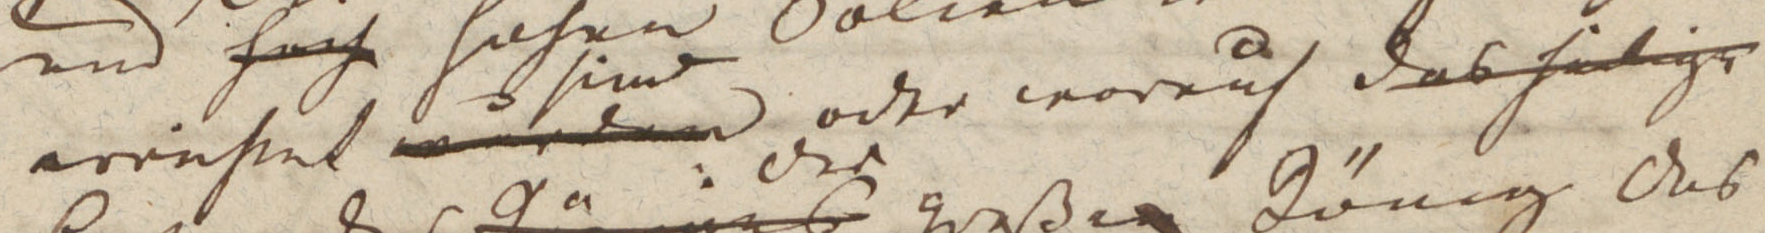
errichtet wurden sind oder worauf das heutige
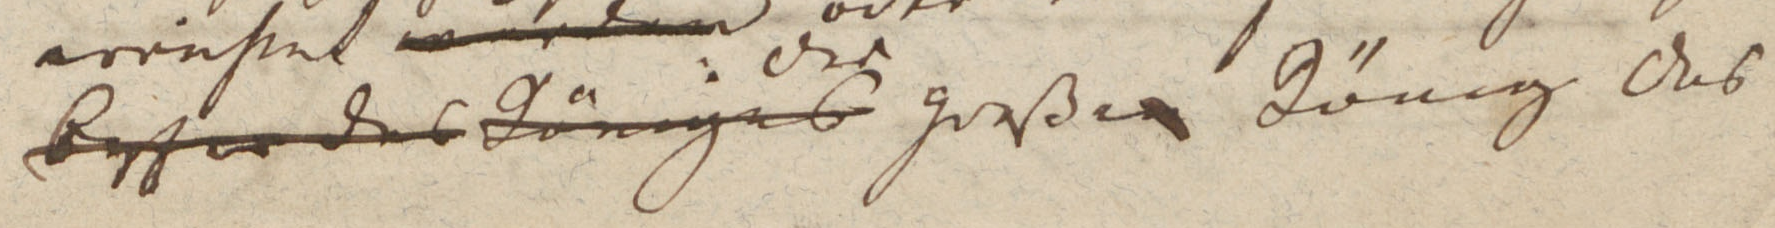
Besser des Königes der grossen König das
